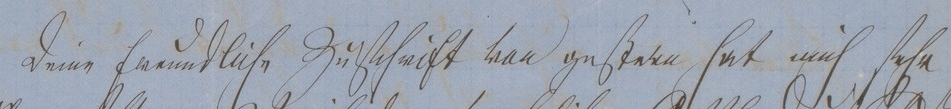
Deine freundliche Zuschrift von gestern hat mich sehr
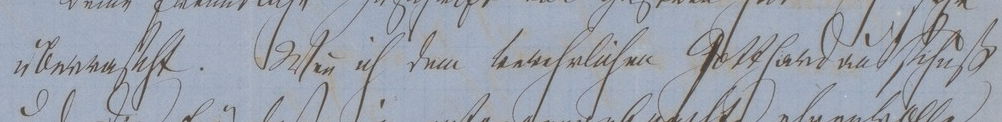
überrascht. Wenn ich dem verehrlichen Gotthardausschuß
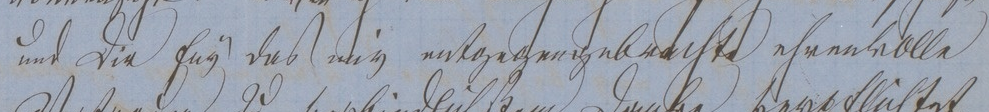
und Dir für das mir entgegengebrachte ehrenvolle
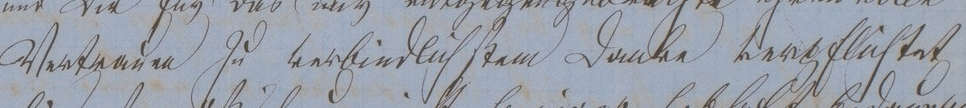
Vertrauen zu verbindlichstem Danke verpflichtet
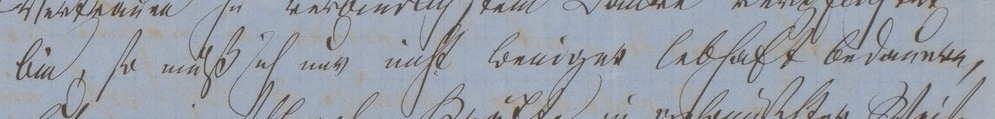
bin, so muß ich nur nicht weniger lebhaft bedauern,
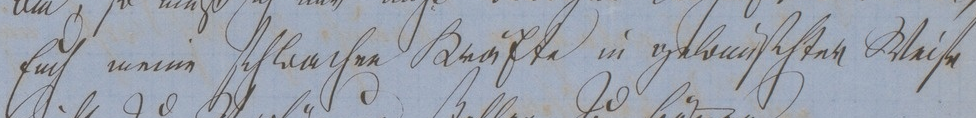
Euch meine schwachen Kräfte in gewünschter Weise
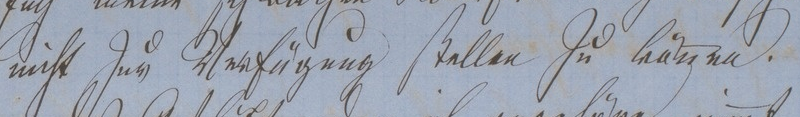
nicht zur Verfügung stellen zu können.
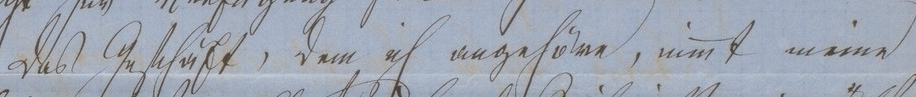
Das Geschäft, dem ich angehöre, nimmt meine
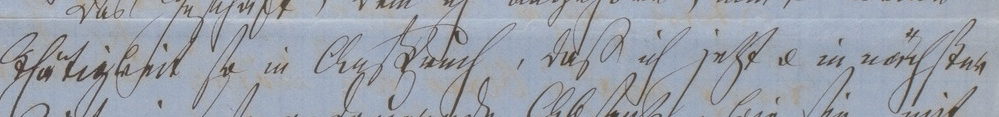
Thätigkeit so in Anspruch, daß ich jezt & in nächster
